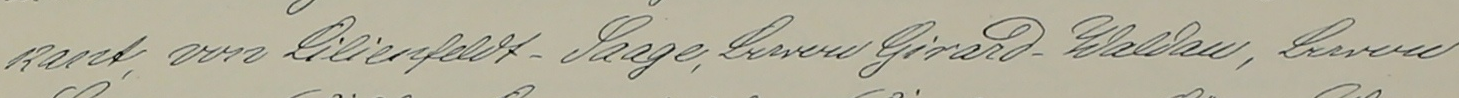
kant, von Lilienfeldt-Saage, Baron Girard-Waldau, Baron
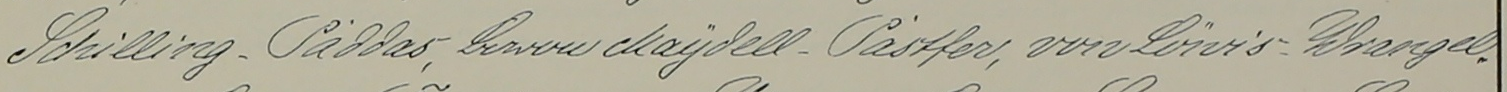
Schilling-Paddas, Baron Maydell-Pastfer, von Löwis-Wrangel-
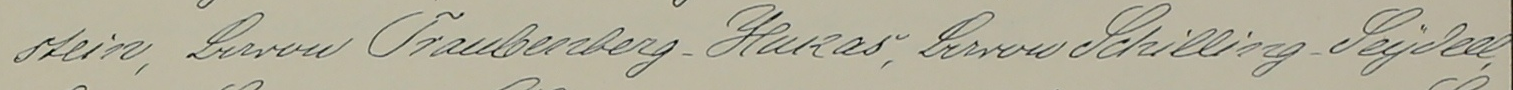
stein, Baron Traubenberg-Hukas, Baron Schilling-Seydell,
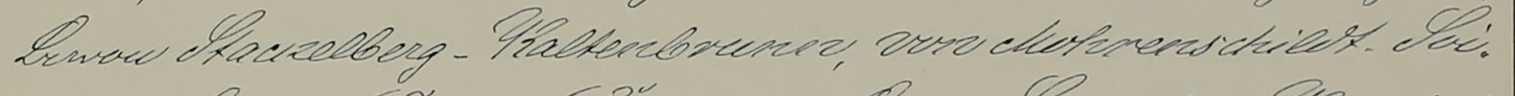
Baron Stackelberg-Kaltenbrunn, von Mohrenschildt-Soi-
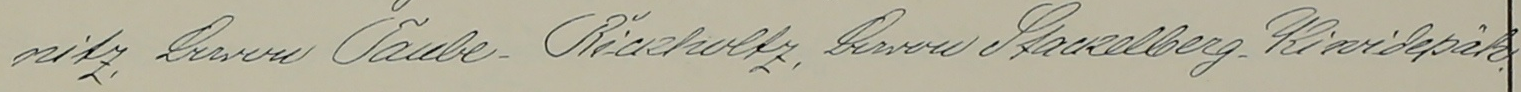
nitz, Baron Taube-Rickholtz, Baron Stackelberg-Kiwidepäh.
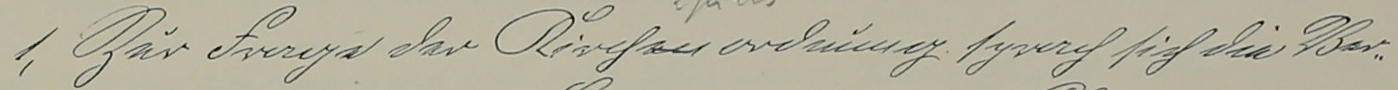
1. Zur Frage der Kirchenordnung sprach sich die Ver-
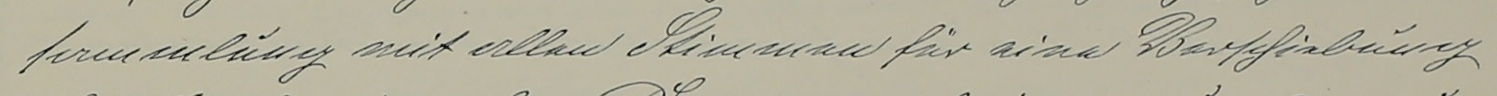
sammlung mit allen Stimmen für eine Verschiebung
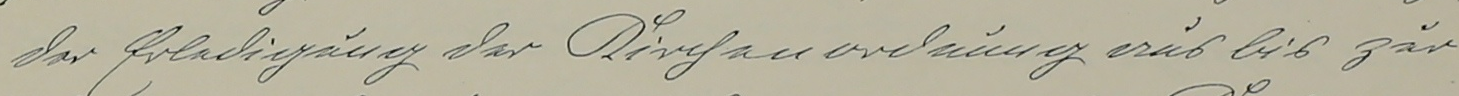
der Erledigung der Kirchenordnung aus bis zur
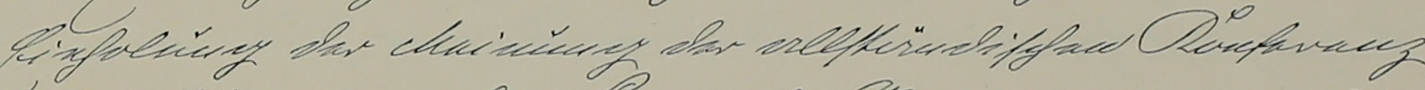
Einholung der Meinung der allständischen Konferenz
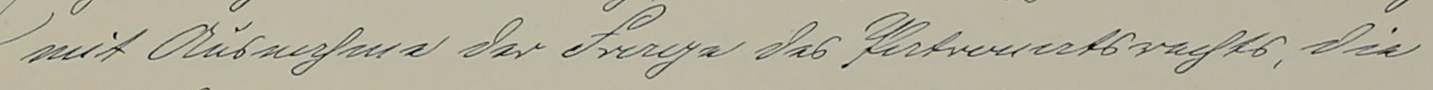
mit Ausnahme der Frage des Patronatsrechts, die
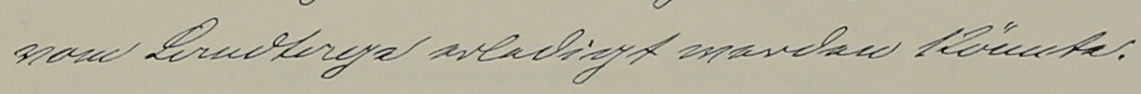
vom Landtage erledigt werden könnte.
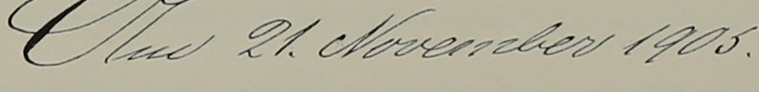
Am 21. November 1905.
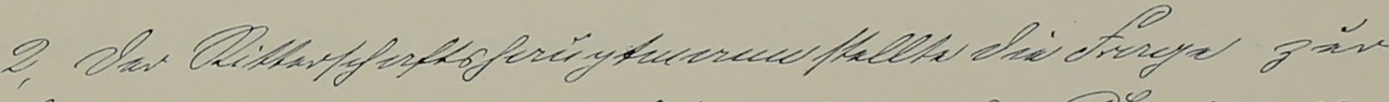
2. Der Ritterschaftshauptmann stellte die Frage zur
